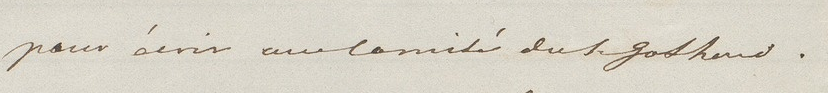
pour écrir au Comité du S. Gothard.
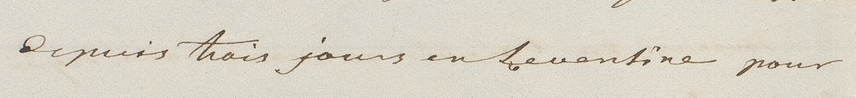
depuis trois jours en Leventine pour
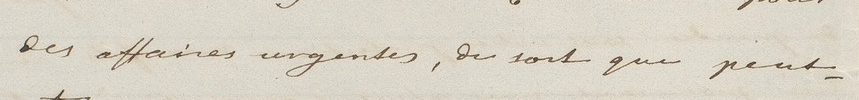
des affaires urgentes, de sort que peut-
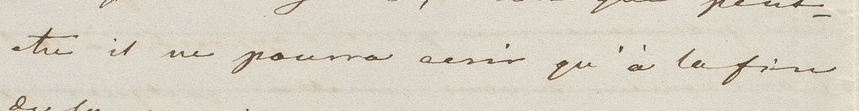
etre il ne pourra ecrir qu'à la fin
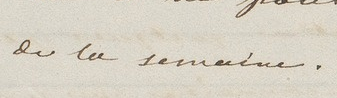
de la semaine.
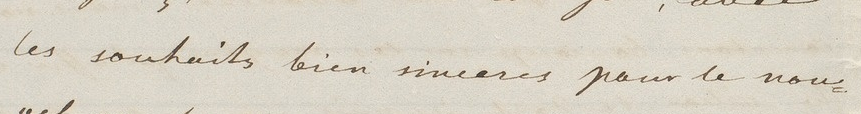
les souhaits bien sinceres pour le nou-
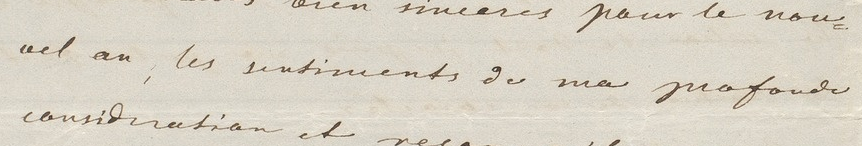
vel an, les sentiments de ma profonde
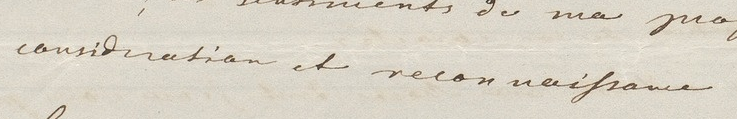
consideration et reconnaissance
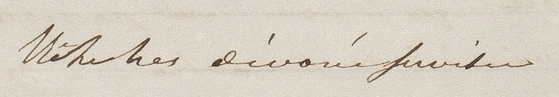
Votre tres dévoué Serviteur
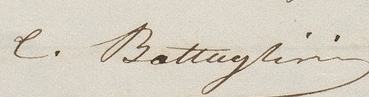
C. Battaglini
